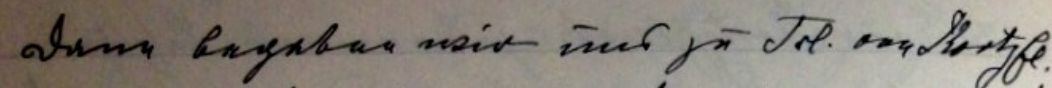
Dann begaben wir uns zu Frl. von Kortzfl.
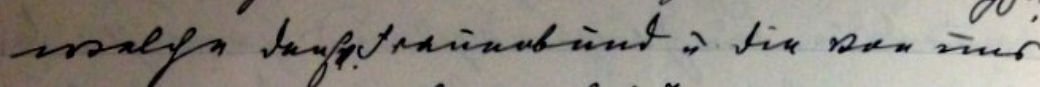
welche den Ev. Frauenbund u. die von uns
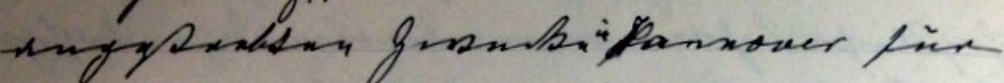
angestebten Zwecke in Hannover für
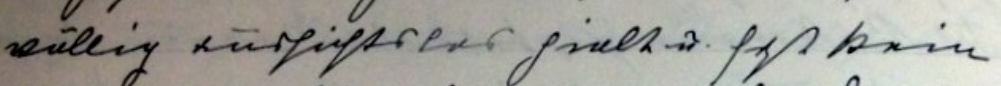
völlig aussichtslos hielt u. fast kein
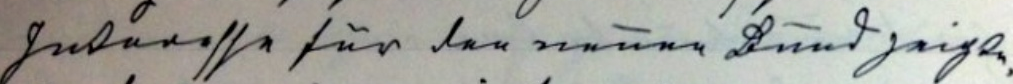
kein Interesse für den neuen Bund zeigte.
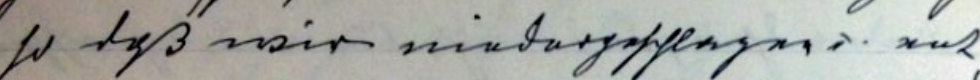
So daß wir niedergeschlagen u. ent
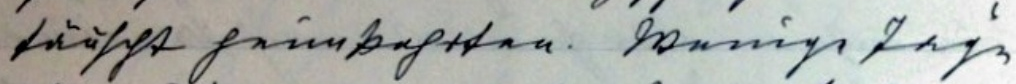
täuscht heimkehrten. Wenige Tage
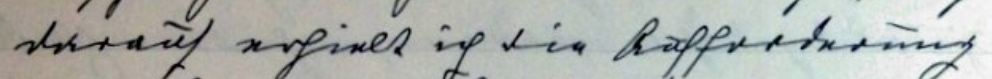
darauf erhielt ich die Aufforderung
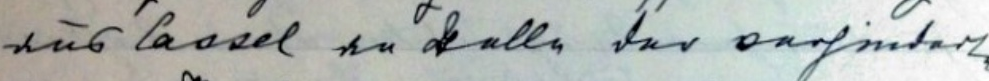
aus Cassel an Stelle der verhinderten
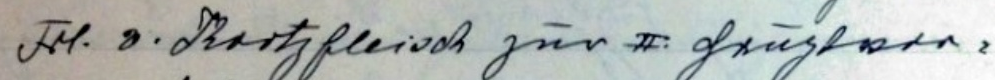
Frl. v. Kortzfleisch zur II. Hauptvor
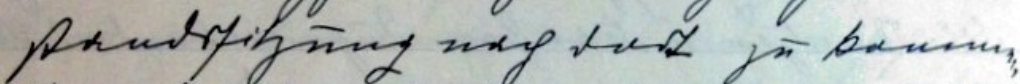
Hauptvorstandssitzung nach dort zu kommen.
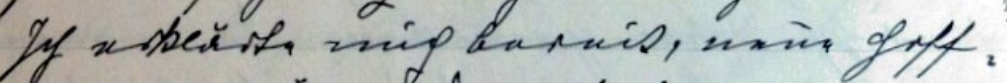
Ich erklärte mich bereit, neue Hoff
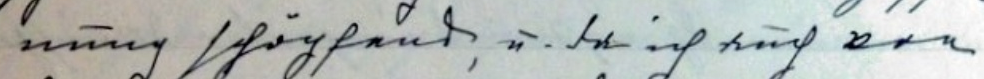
Hoffnung schöpfend u. da ich auch von
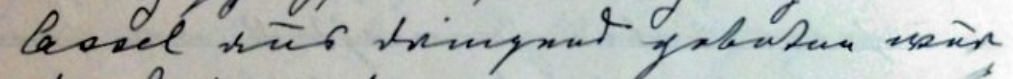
Cassel aus dringend gebeten wur
